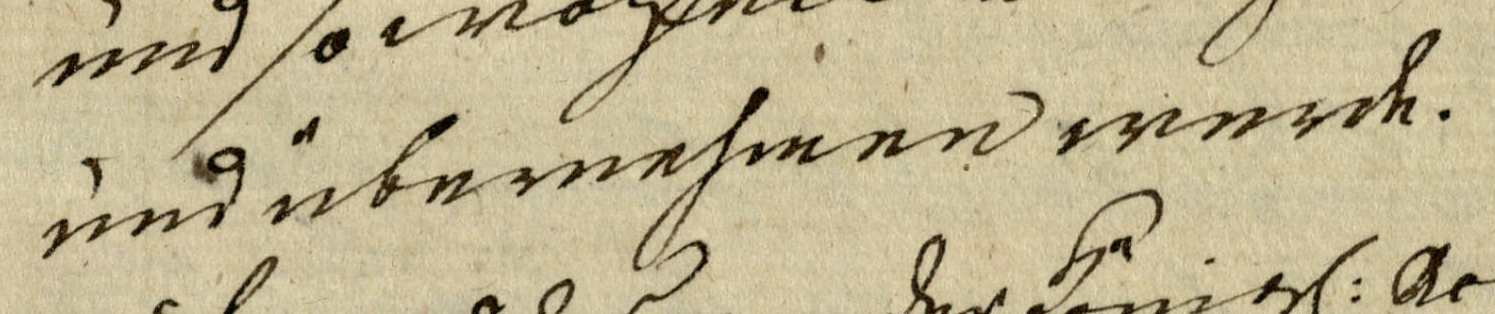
und übernehmen werde.
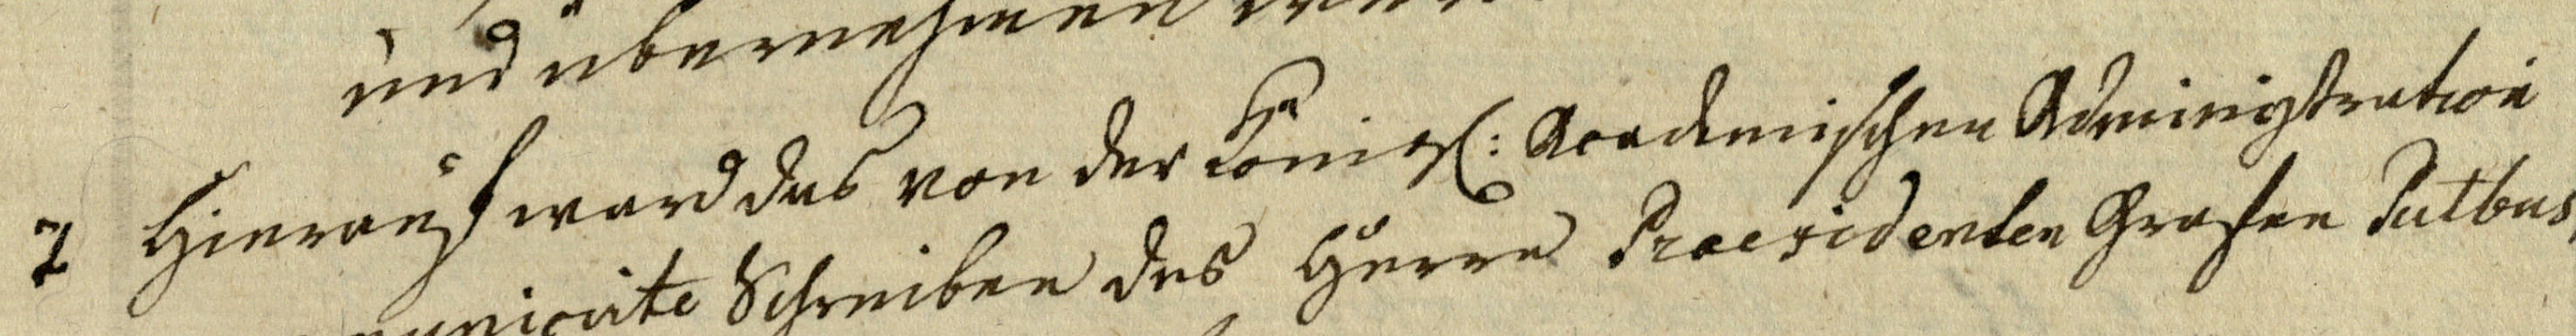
2. Hierauf ward das von der Königl. Academischen Administration
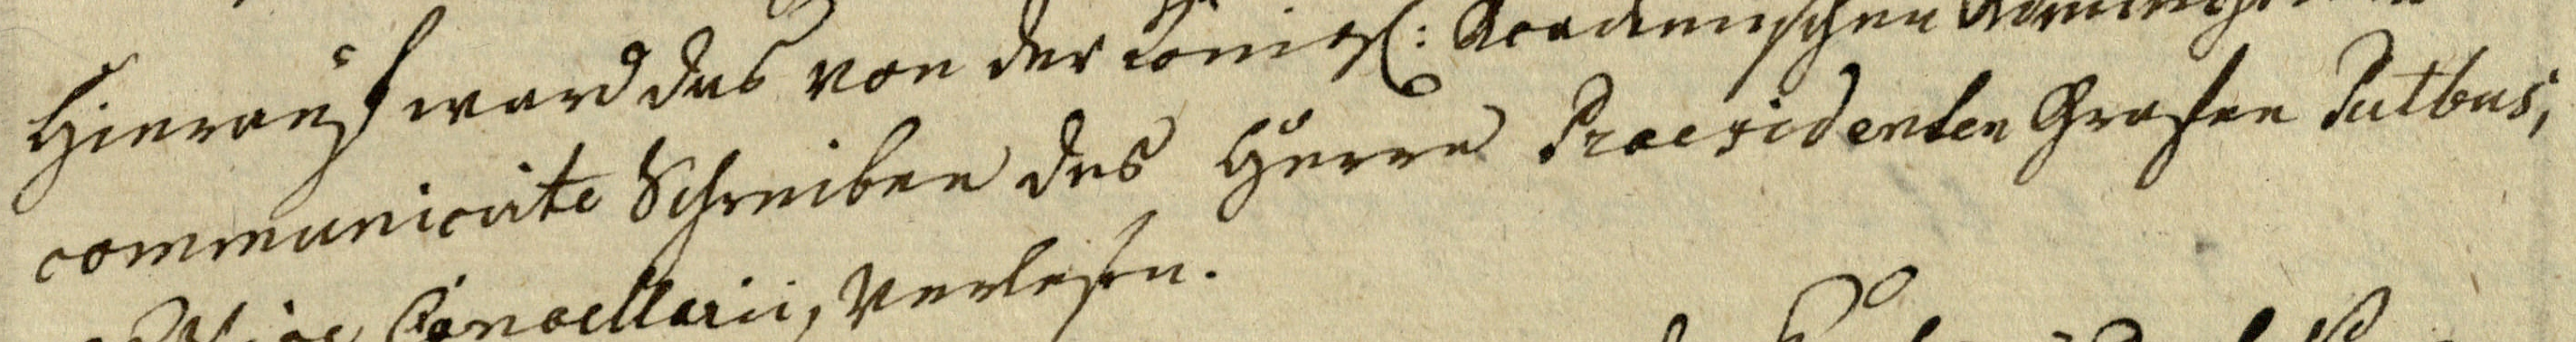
communicirte Schreiben des Herrn Praesidenten Grafen Putbus,
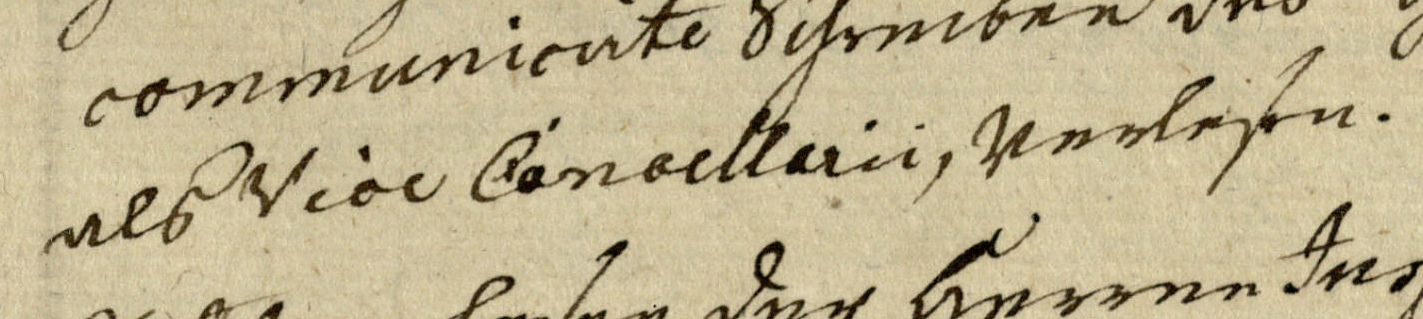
als Vice Cancellarii, verlesen.
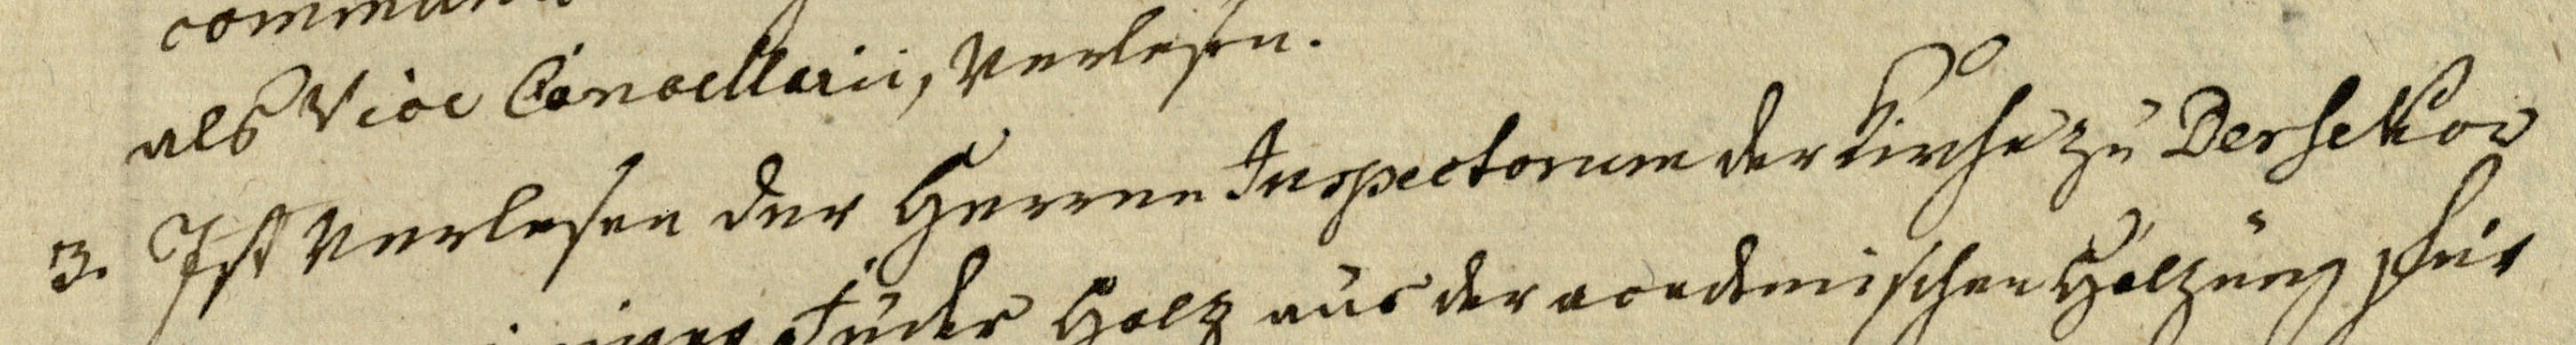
3. Ist verlesen der Herren Inspectorum der Kirche zu Dersekow
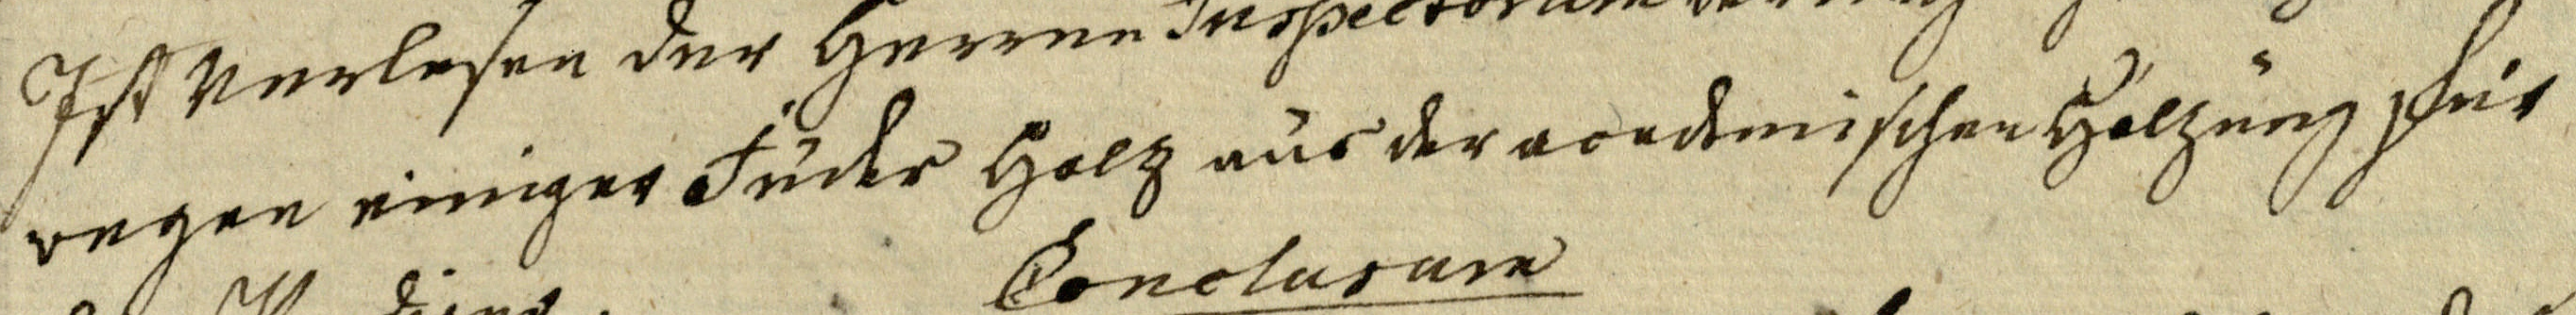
wegen einiger Fuder Holz aus der academischen Holzung für
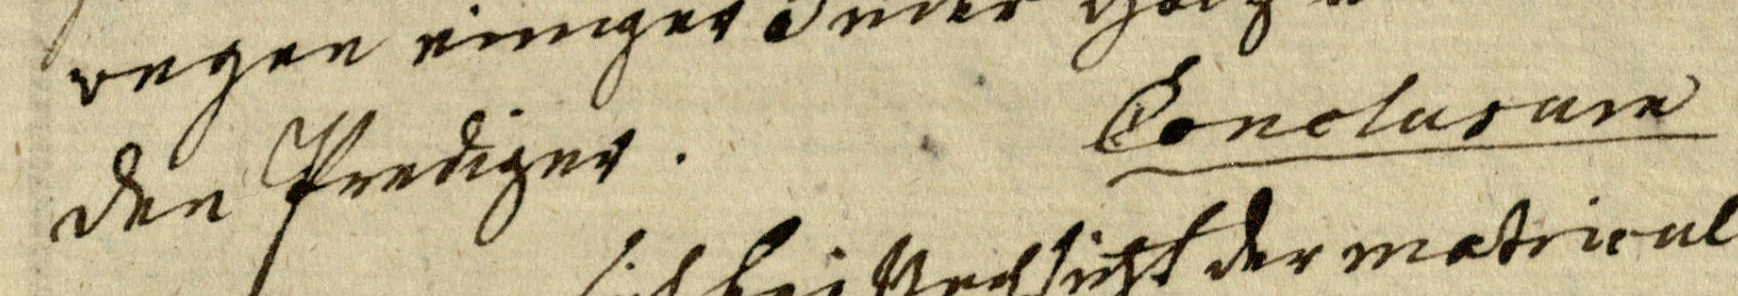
den Prediger. Conclusum
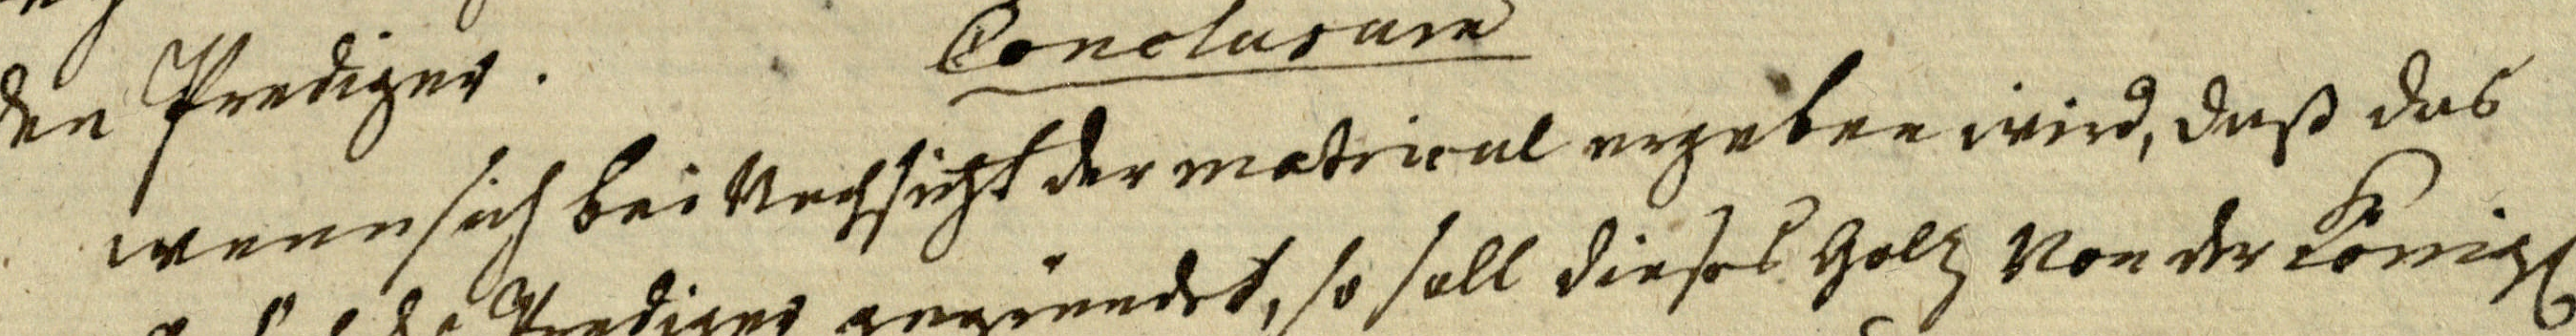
Wenn sich bei Nachsicht der matricul ergeben wird, daß das
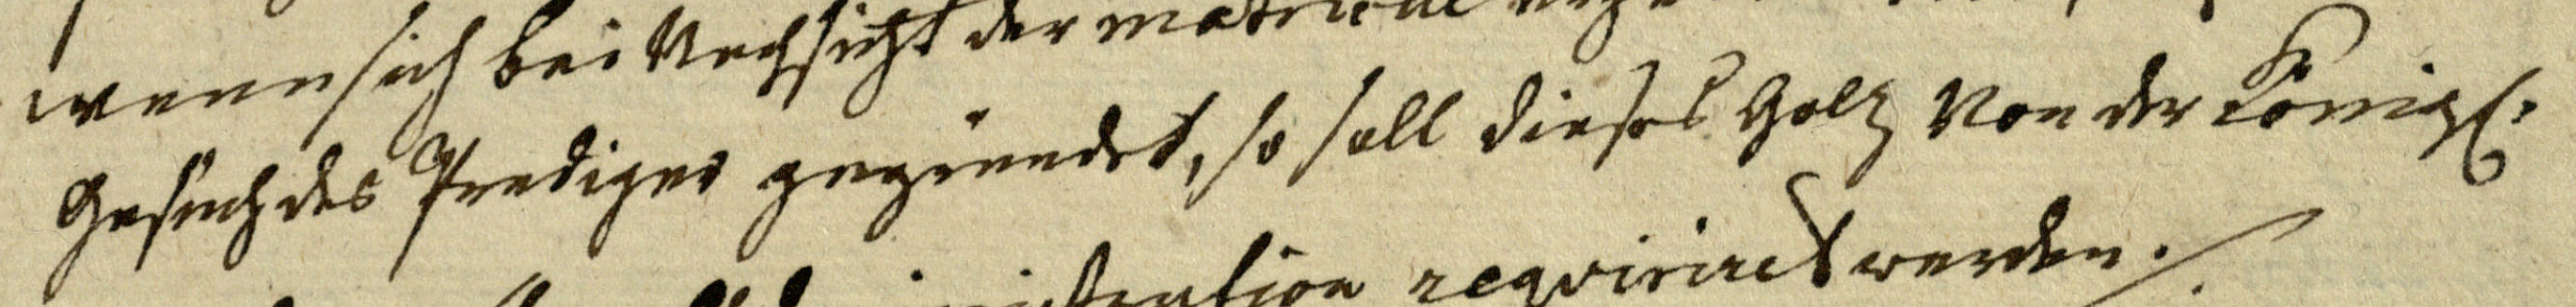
Gesuch des Prediger gegründet, so soll dieses Holz von der Königl.
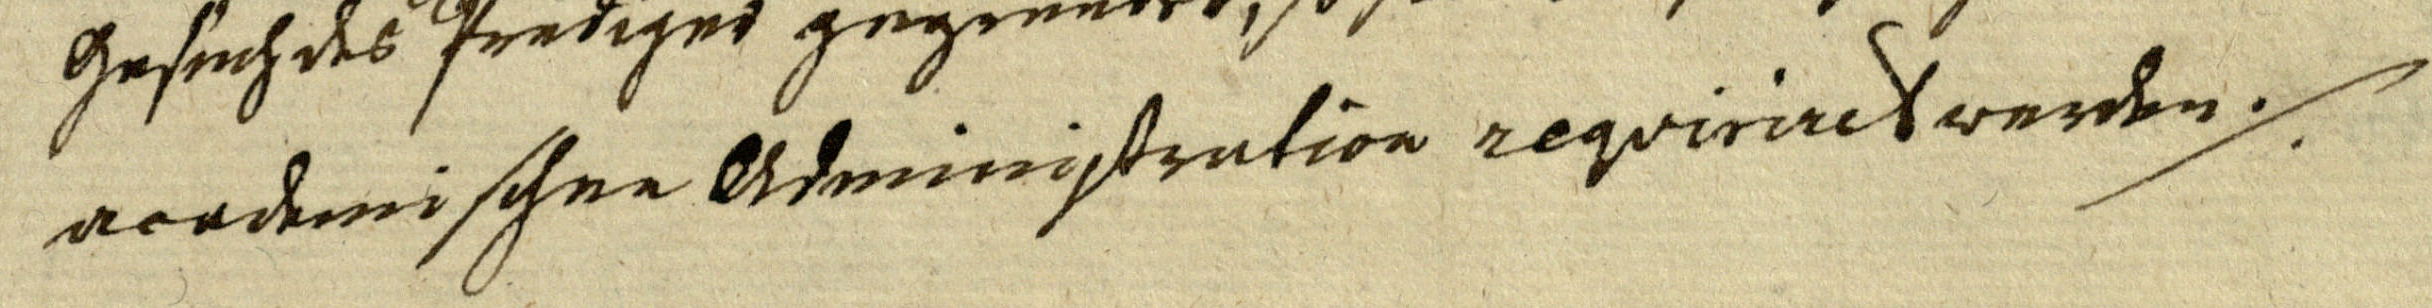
academischen Administration requiriret werden.
